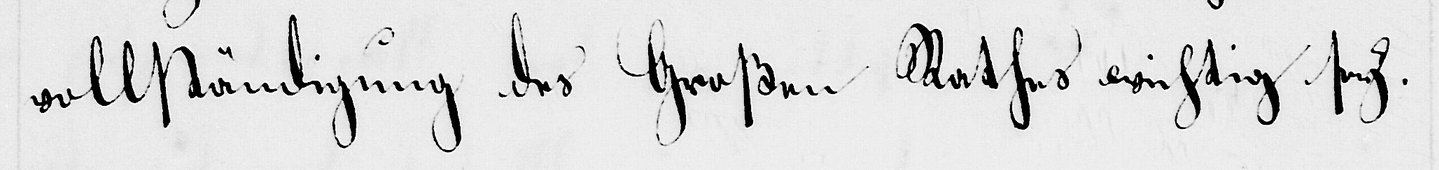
vollständigung des Großen Rathes wichtig sey.
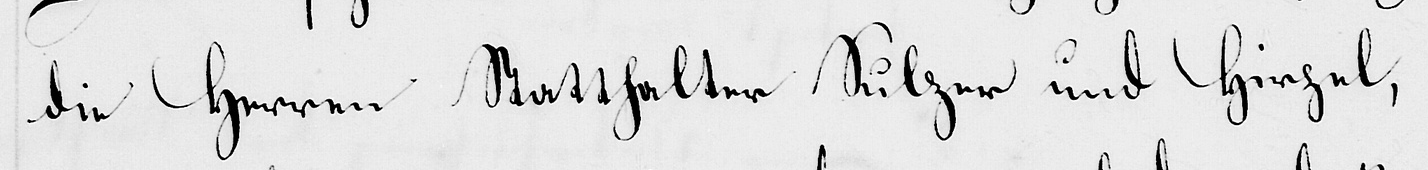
die Herren Statthalter Sulzer und Hirzel,
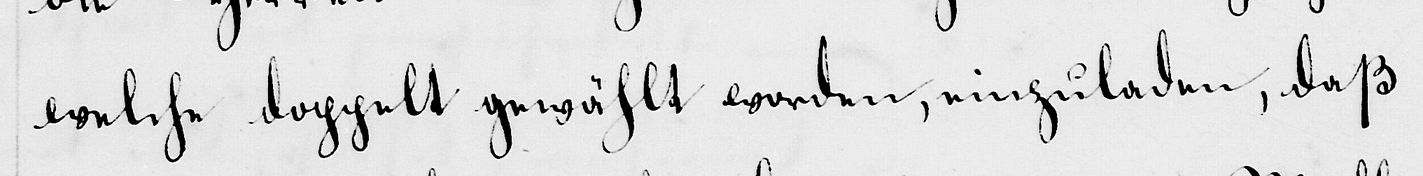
welche doppelt gewählt worden, einzuladen, daß
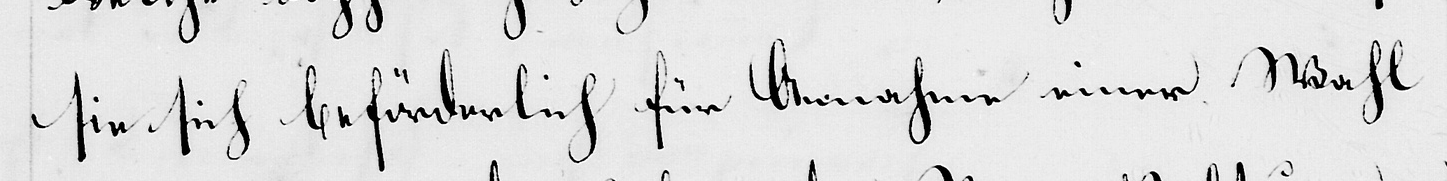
sie sich beförderlich für Annahme einer Wahl
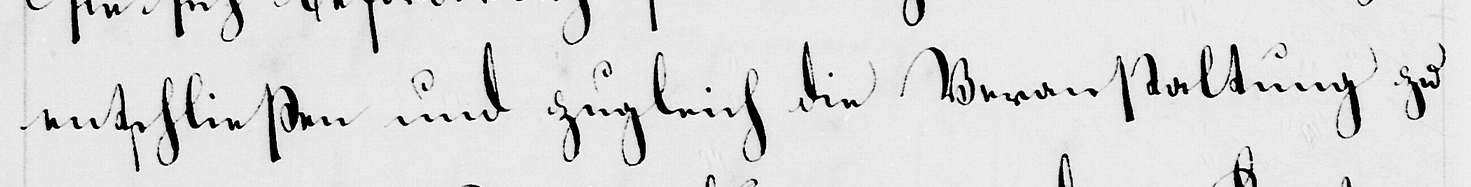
entschließen und zugleich die Veranstaltung zu
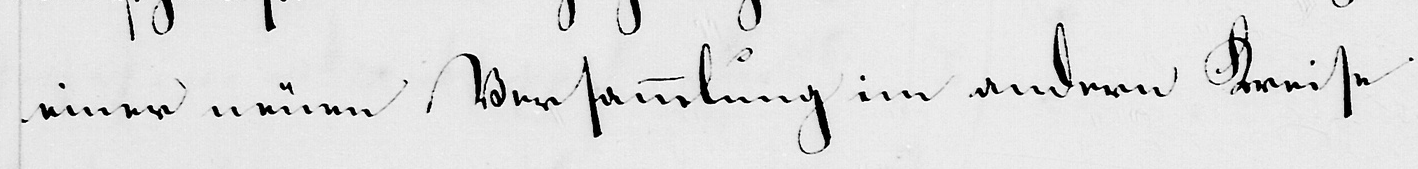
einer neuen Versammlung im andern Kreise
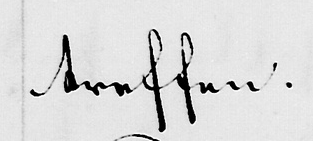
treffen.
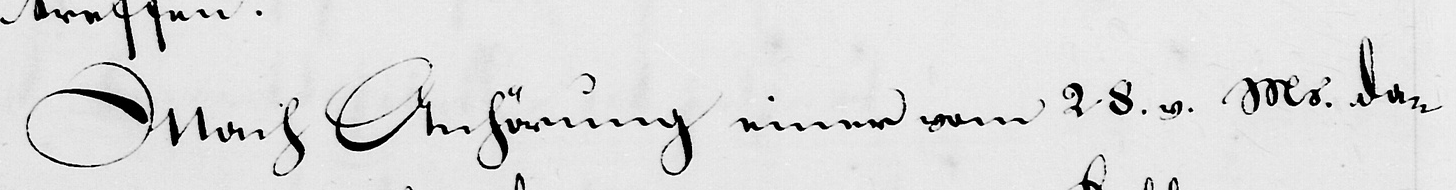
Nach Anhörung einer vom 28. v. Ms. da¬
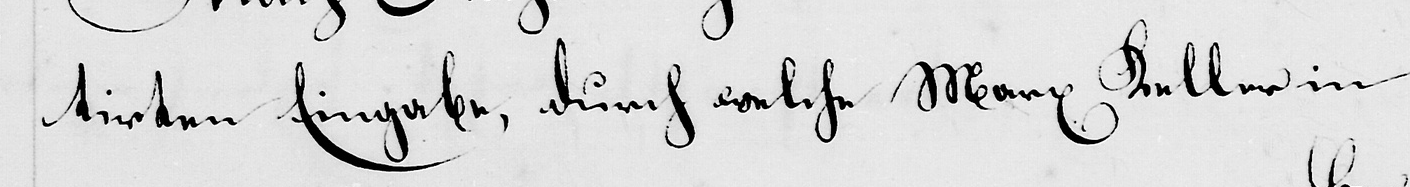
tirten Eingabe, durch welche Marx Keller in
